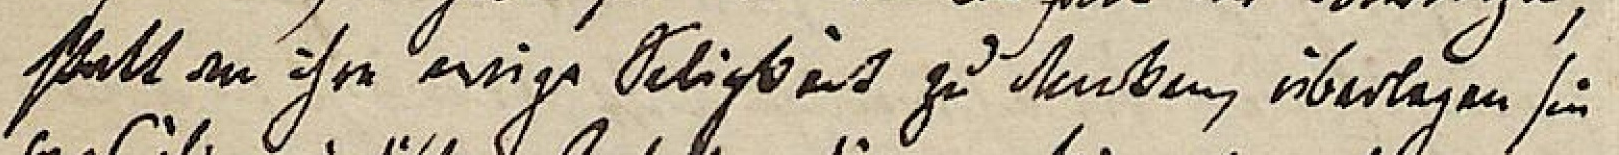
stat an ihre ewige Seligkeit zu denken, überlegen sie
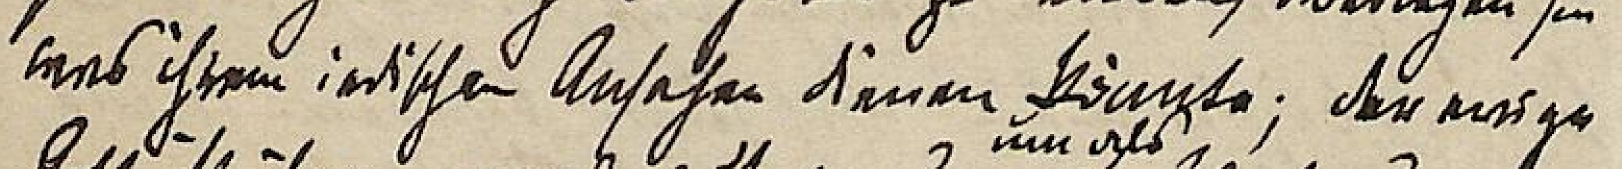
was ihrem irdischen Ansehen dienen könnte; der ewige
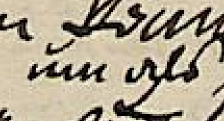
um als
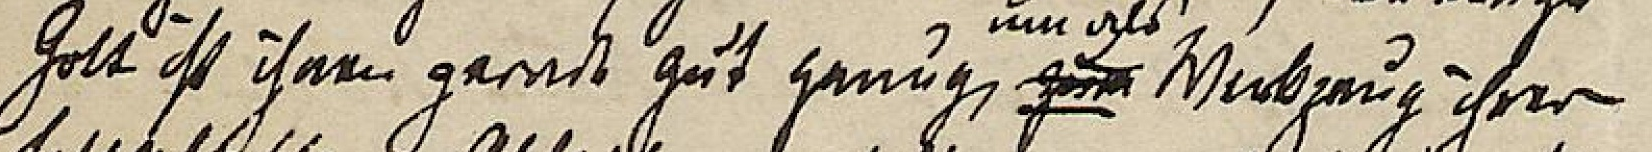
Gott ist ihnen gerade gut genug, zum Werkzeug ihrer
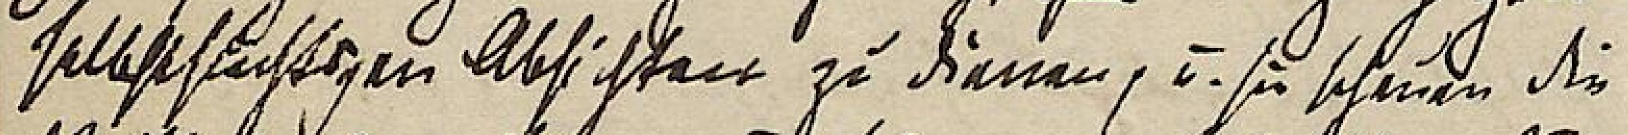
selbssüchtigen Absichten zu dienen, u. sie scheuen die
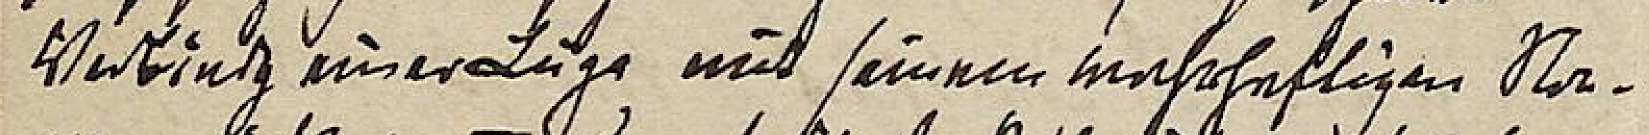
Verbindg einer Lüge mit seinem wahrhaftigen Na¬
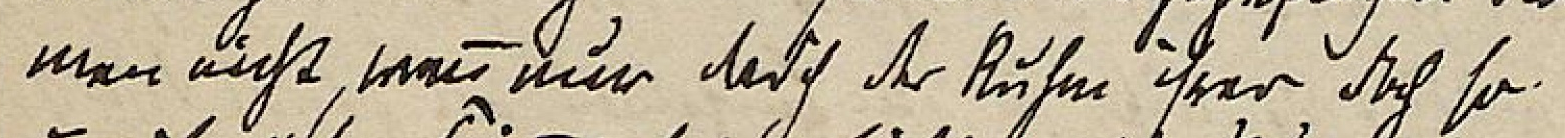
men nicht, wen nur dadch der Ruhm ihrer doch so
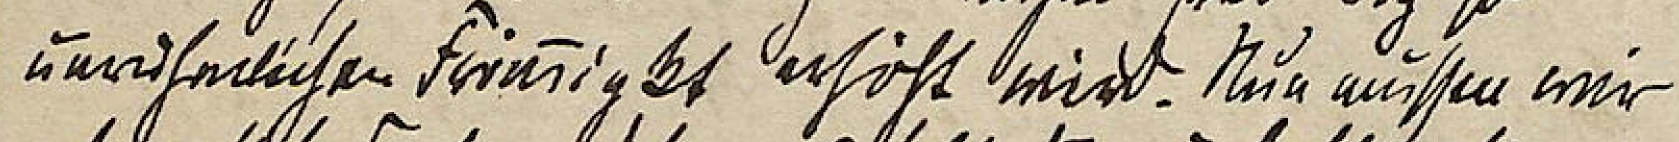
unrühmlichen Frömigkt erhöht wird. Nun müssen wir
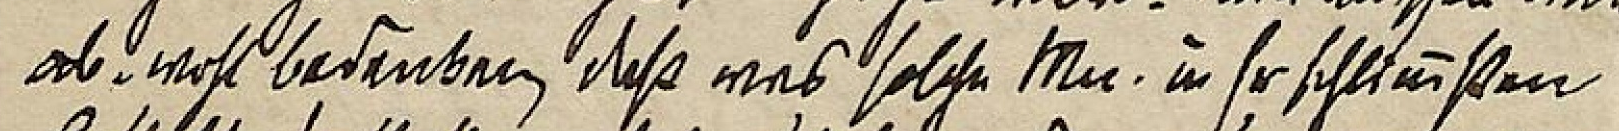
ab. wohl bedenken, daß was solche Mn. in sr. schlimsten
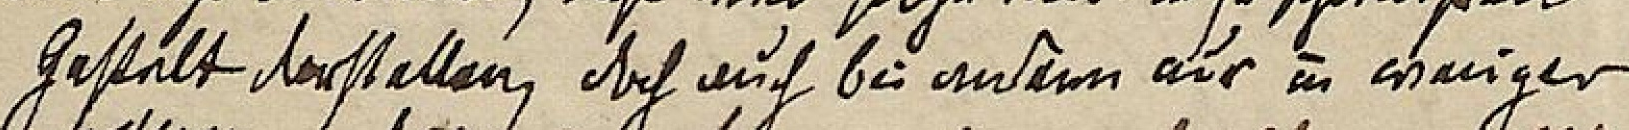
Gestalt darstellen, doch auch bei andern nur in weniger
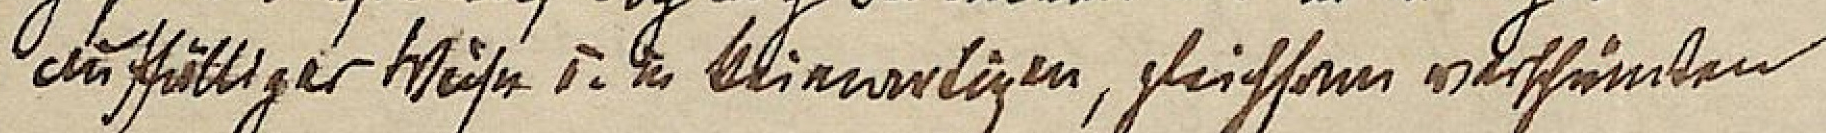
auffälliger Weise u. in keinwertigen, gleichsam verschämten
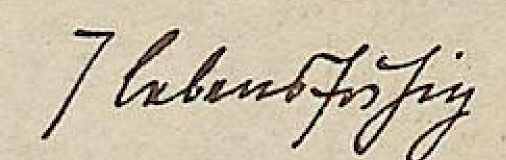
] lebensfähig
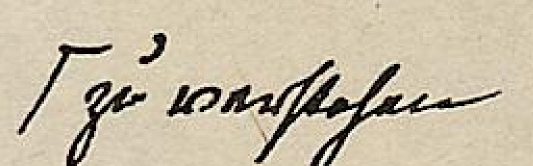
[ zu verstehen
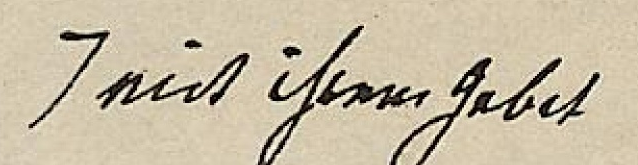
] nicht ihrem Gebet
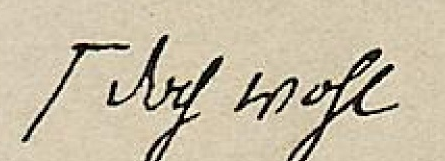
[ doch wohl
